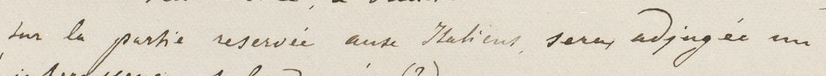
sur la partie reservée aux Italiens, seras adjugée un
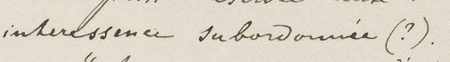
interessence subordonnée (?).
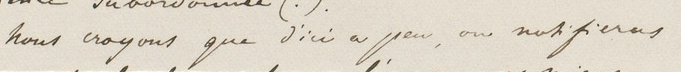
Nous croyons que d'ici a peu, on notifieras
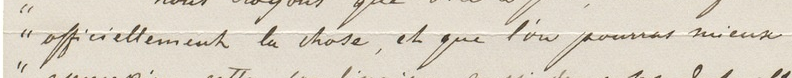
officiellement la chose, et que l'on pourras mieux
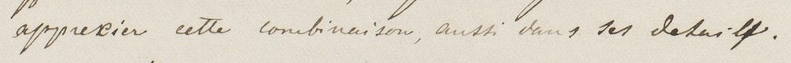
apprecier cette combinaison, aussi dans ses details.»
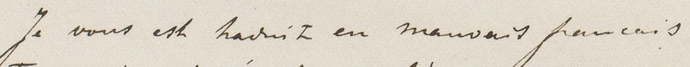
Je vous est traduit en mauvais francais
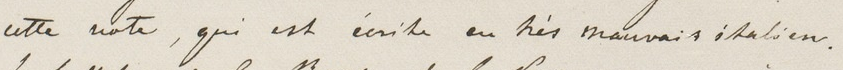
cette note, qui est écrite en très mauvais italien.
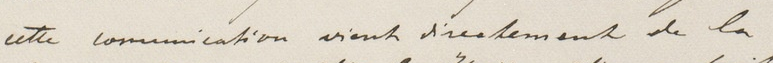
cette communication vient directement de la
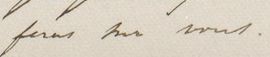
feras sur vous.
